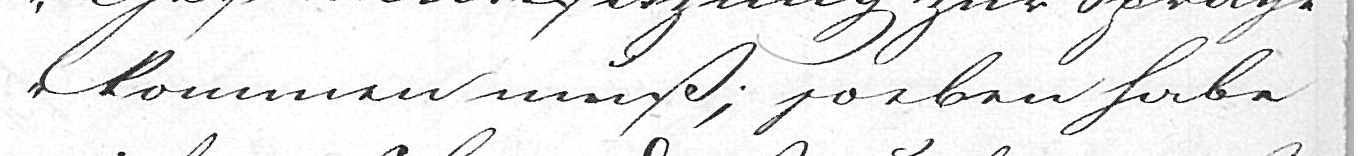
" kommen muß; soeben habe
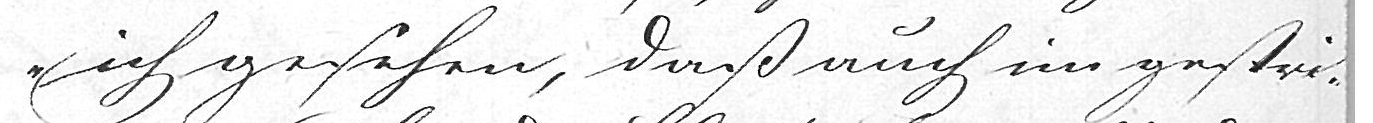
" ich gesehen, daß auch im gestri-
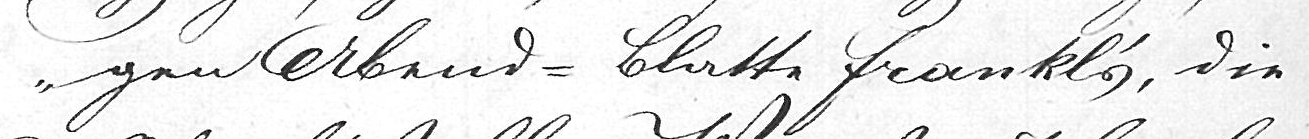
" gen Abend-Blatte Frankl's, die
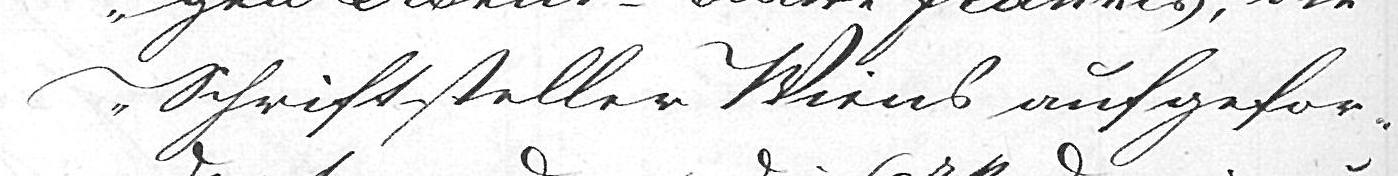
" Schriftsteller Wiens aufgefor-
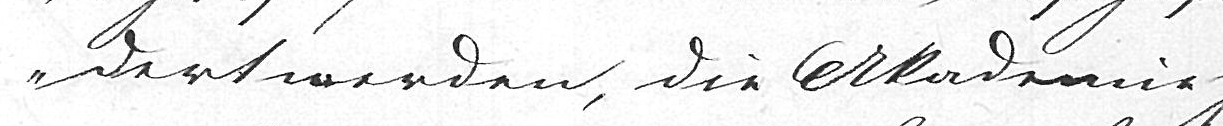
" dert werden, die Akademie zu
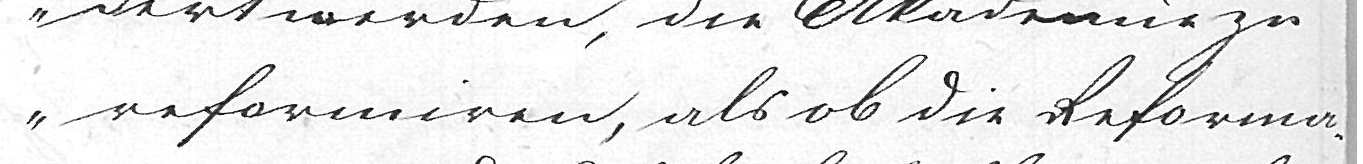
" reformiren, als ob die Reforma-
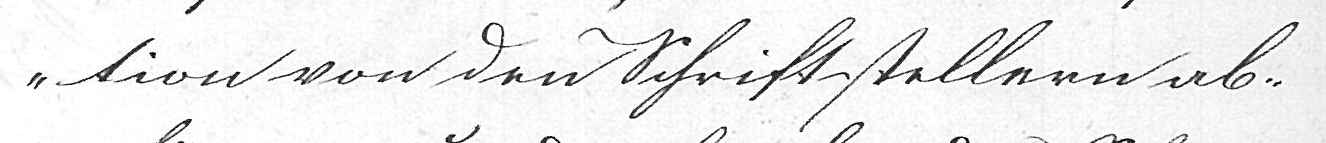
" tion von Schriftstellern ab-
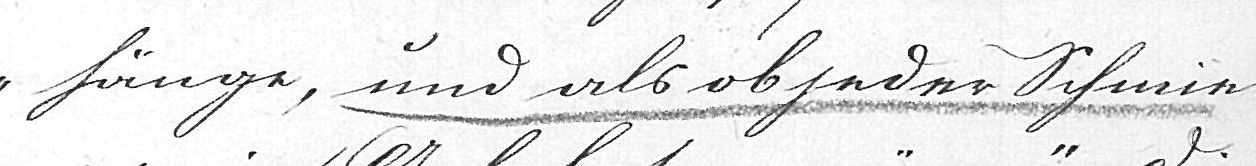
" hänge, und als ob jeder Schmier-
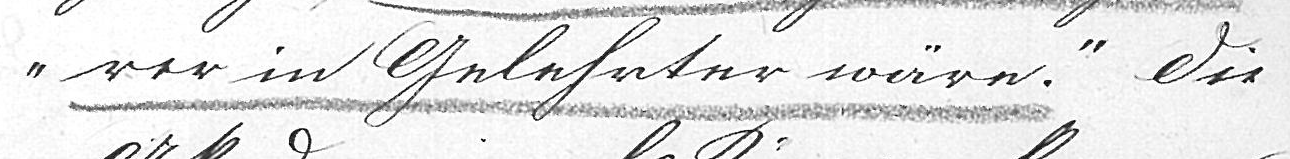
" rer in Gelehrter wäre." Die
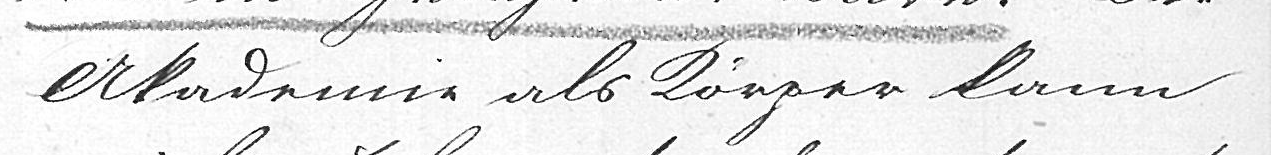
Akademie als Körper kann
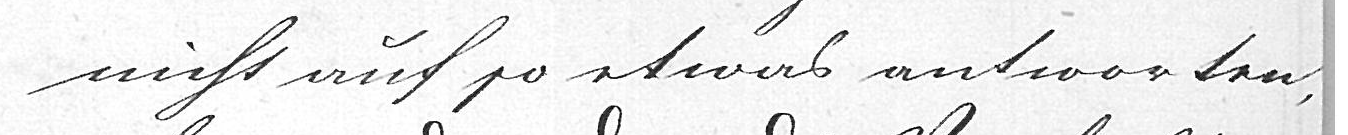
nicht auf so etwas antworten;
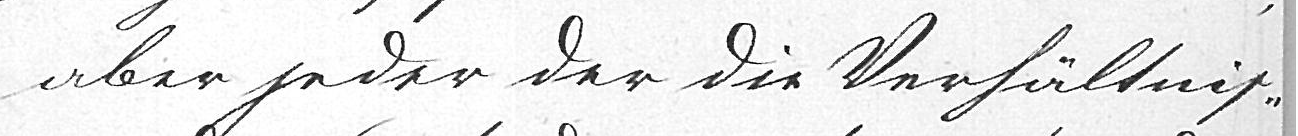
aber jeder der die Verhältnis-
